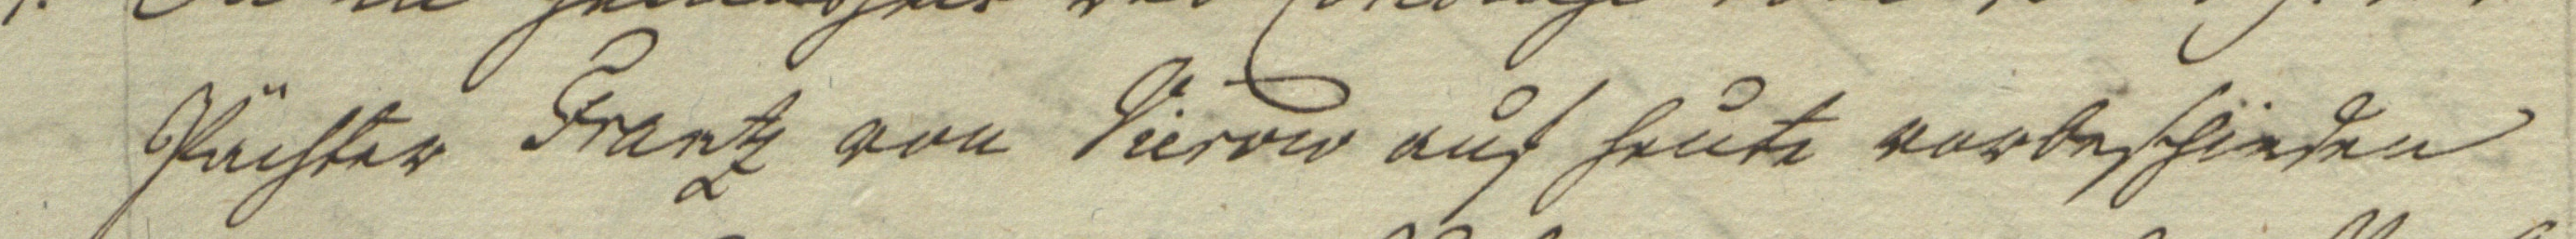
Pächter Frantz von Vierow auf heute vorbeschieden
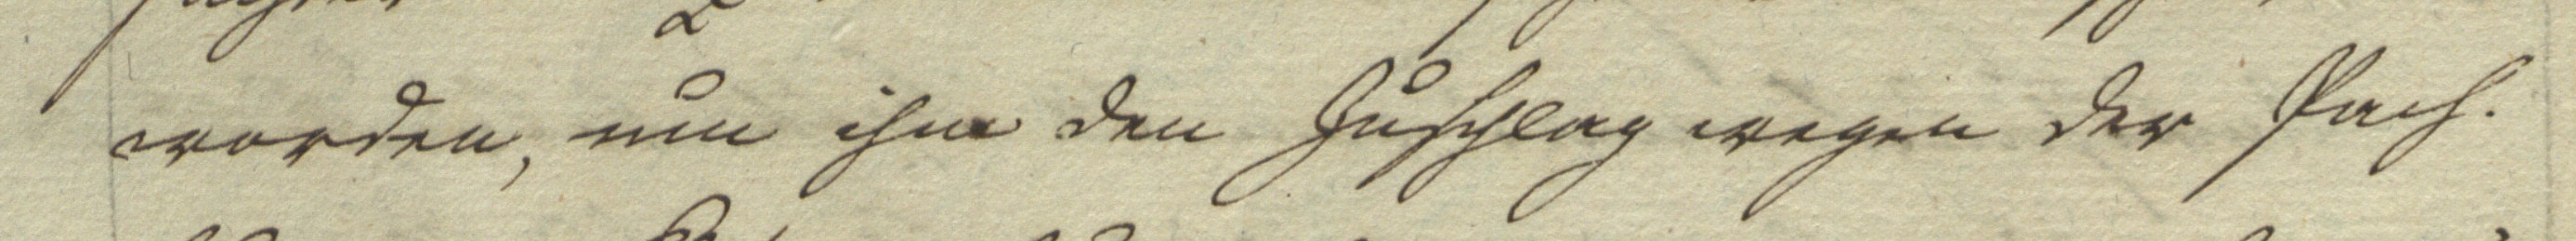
worden, um ihm den Zuschlag wegen der Pach¬
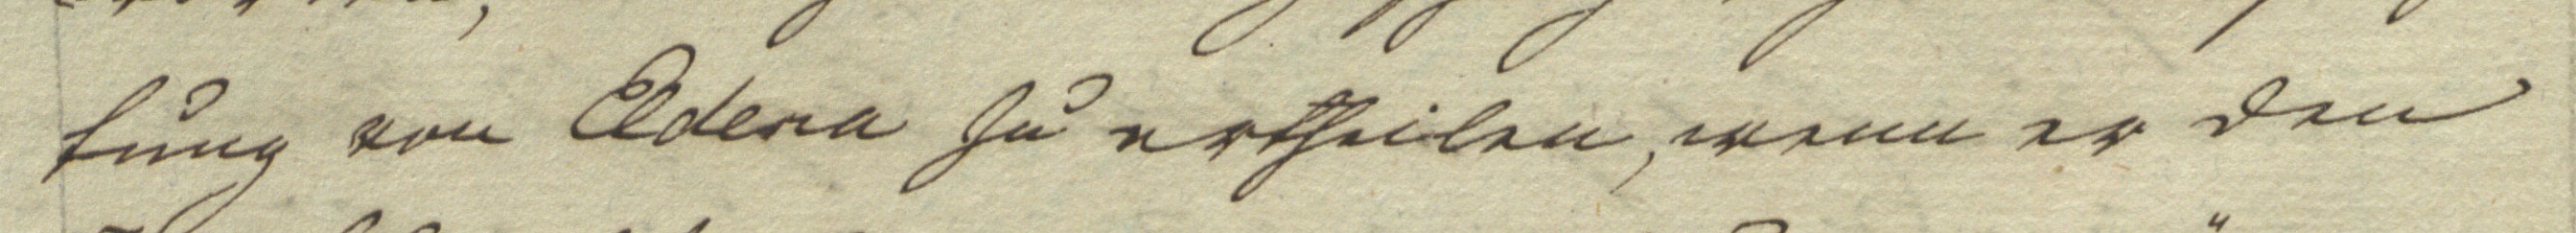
tung von Eldena zu ertheilen, wenn er den
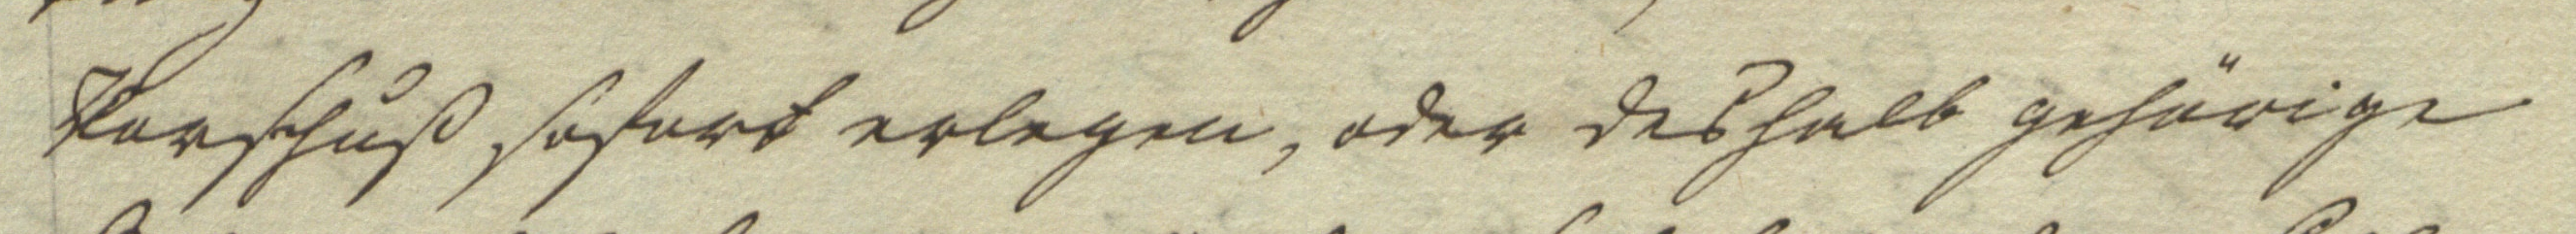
Vorschuß sofort erlegen, oder deshalb gehörige
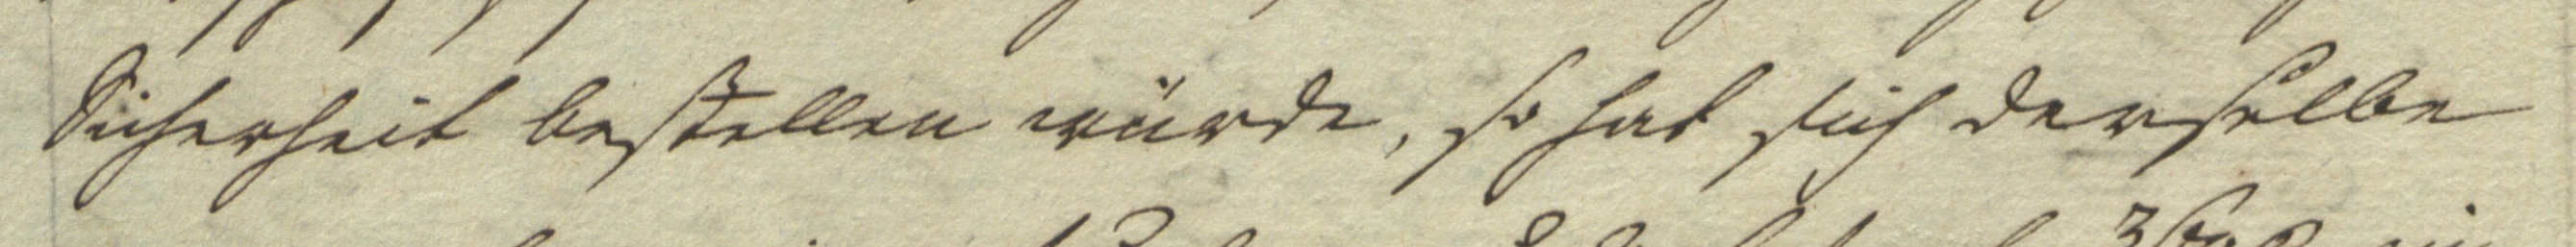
Sicherheit bestellen würde, so hat sich derselbe
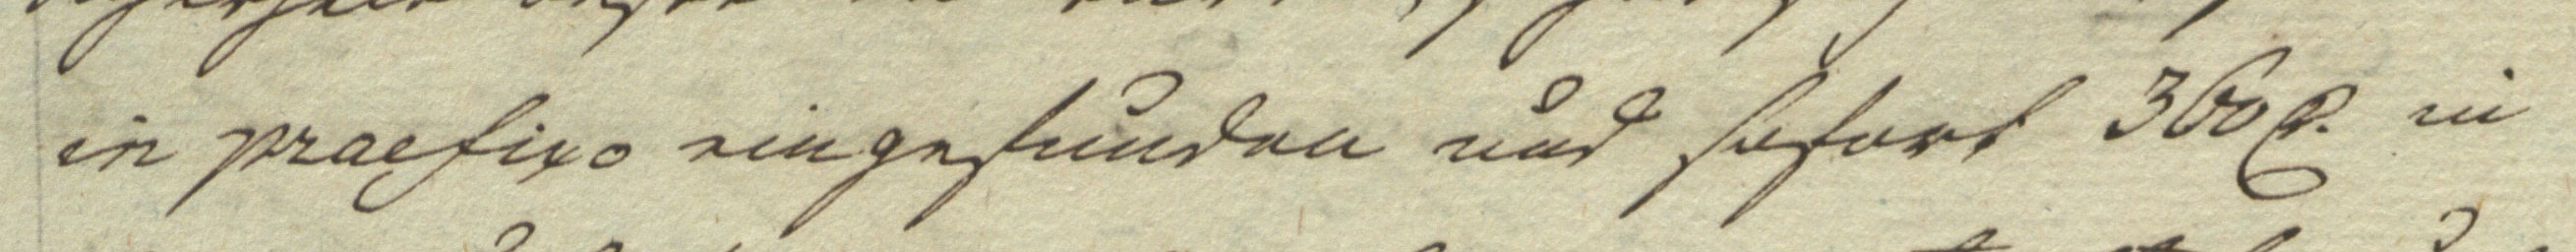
in praefixo eingefunden und sofort 360 l. in
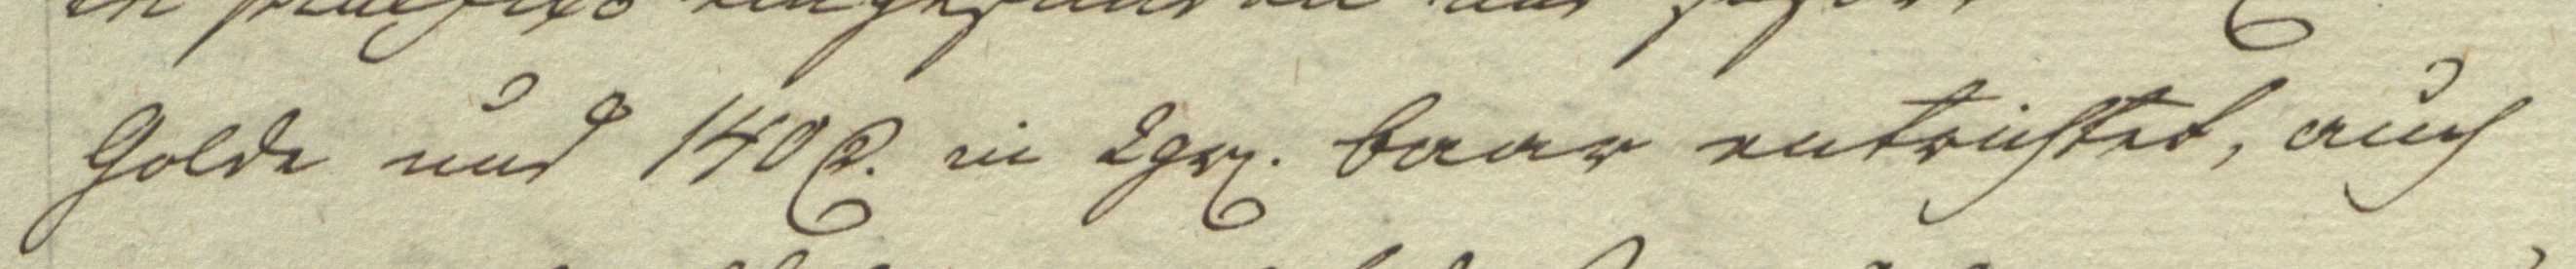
Golde und 140 l. in gr. baar entrichtet, auch
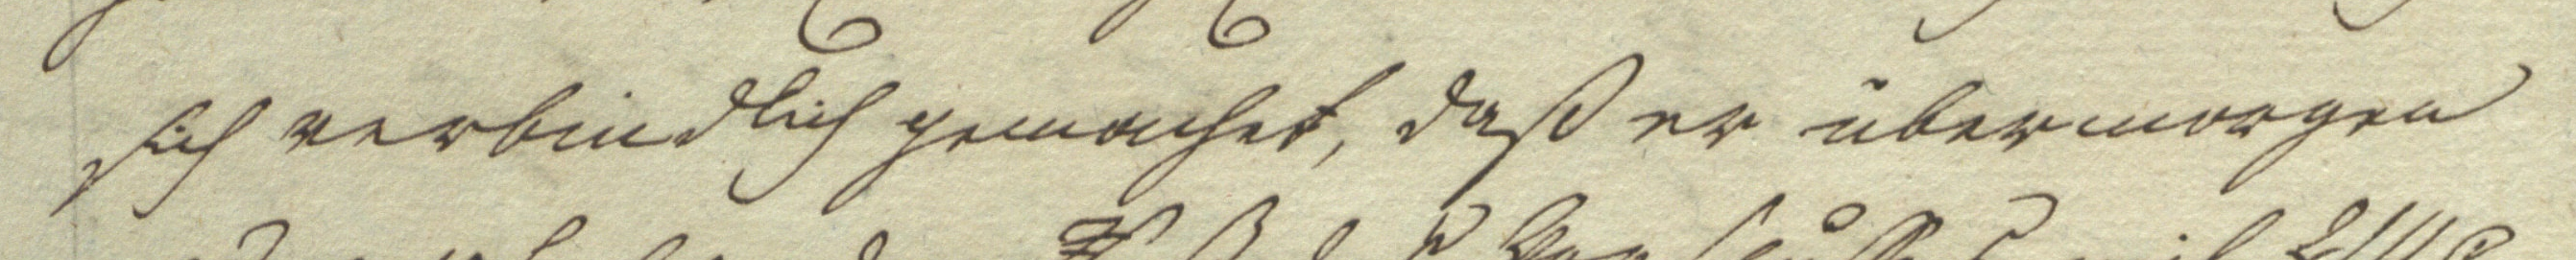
sich verbindlich gemachet, daß er übermorgen
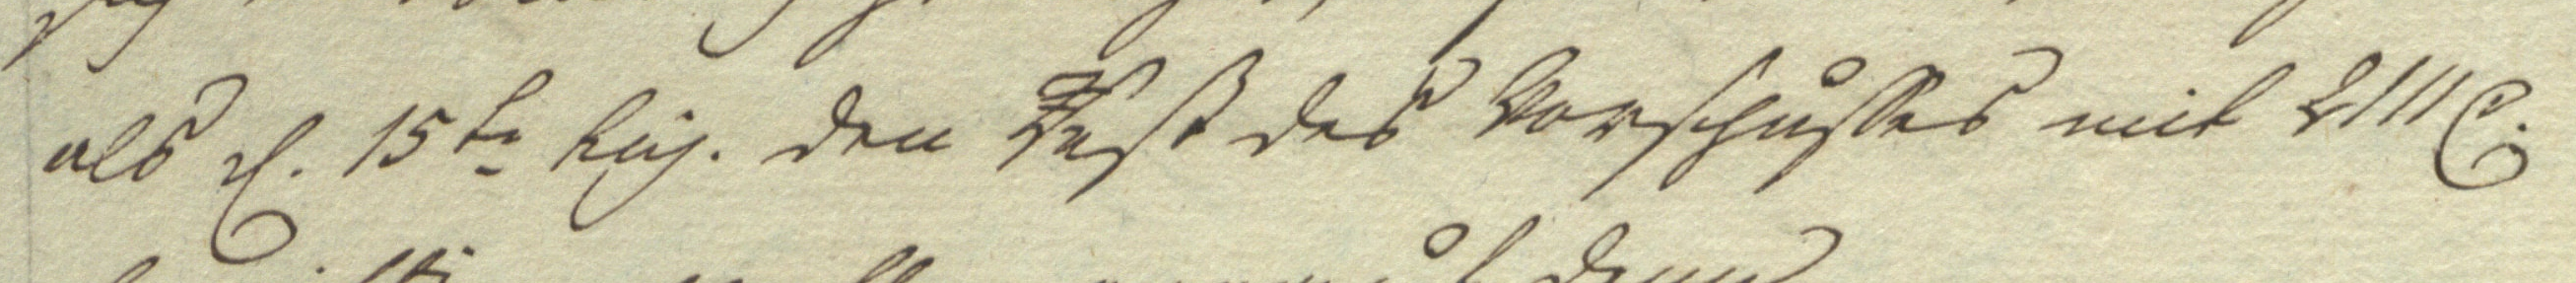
als d. 15 t. huj. den Rest des Vorschusses mit 2111 l.
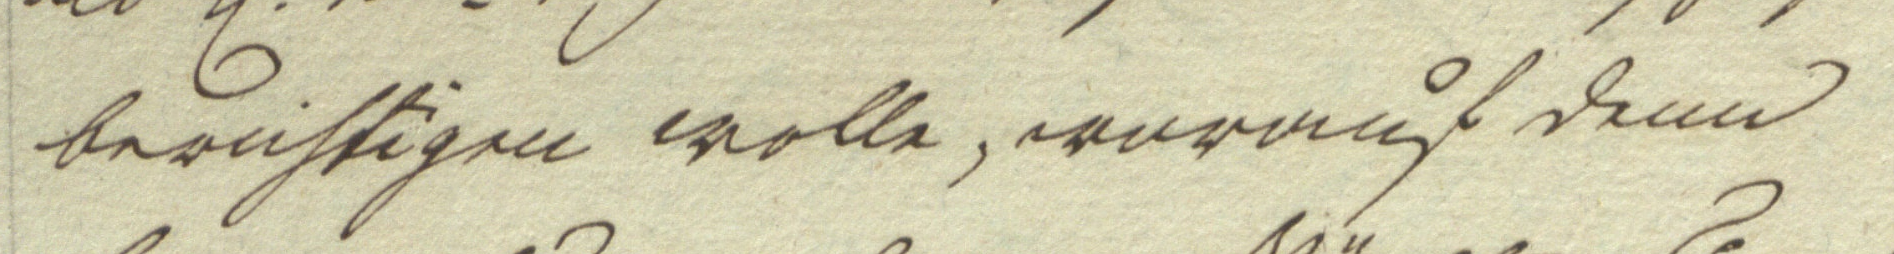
berichtigen wolle, worauf denn
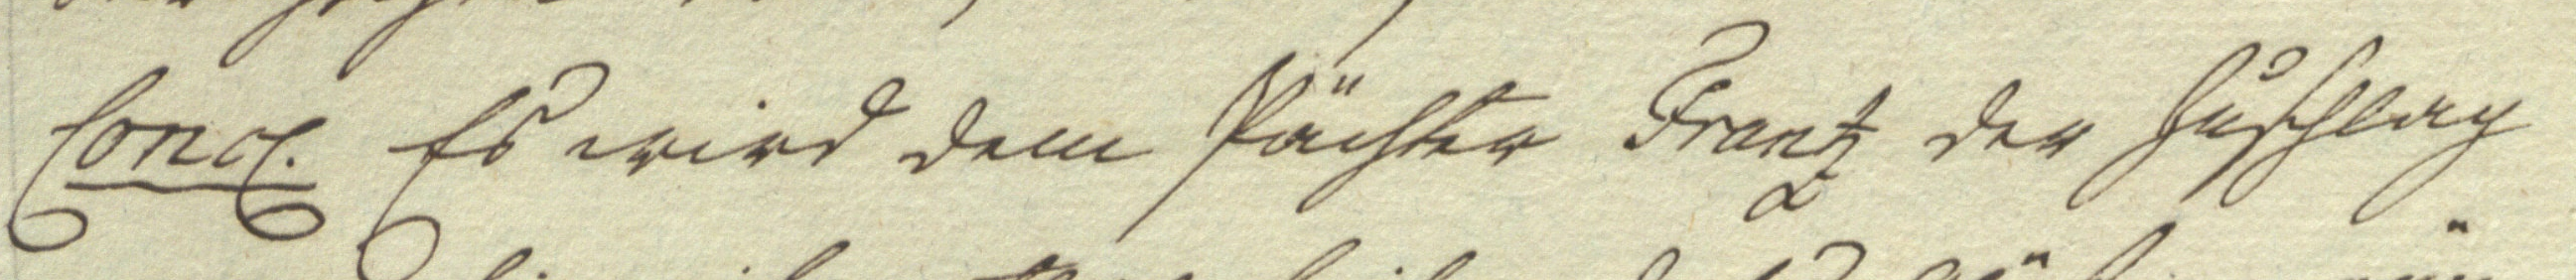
Concl. Es wird dem Pächter Frantz der Zuschlag
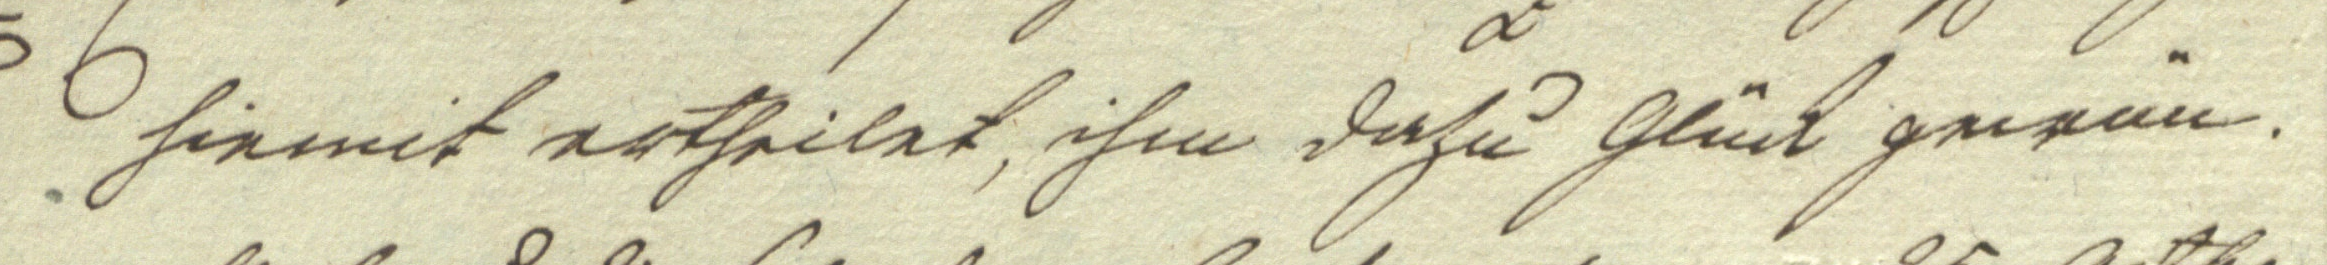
hiemit ertheilet, ihm dazu Glück gewün¬
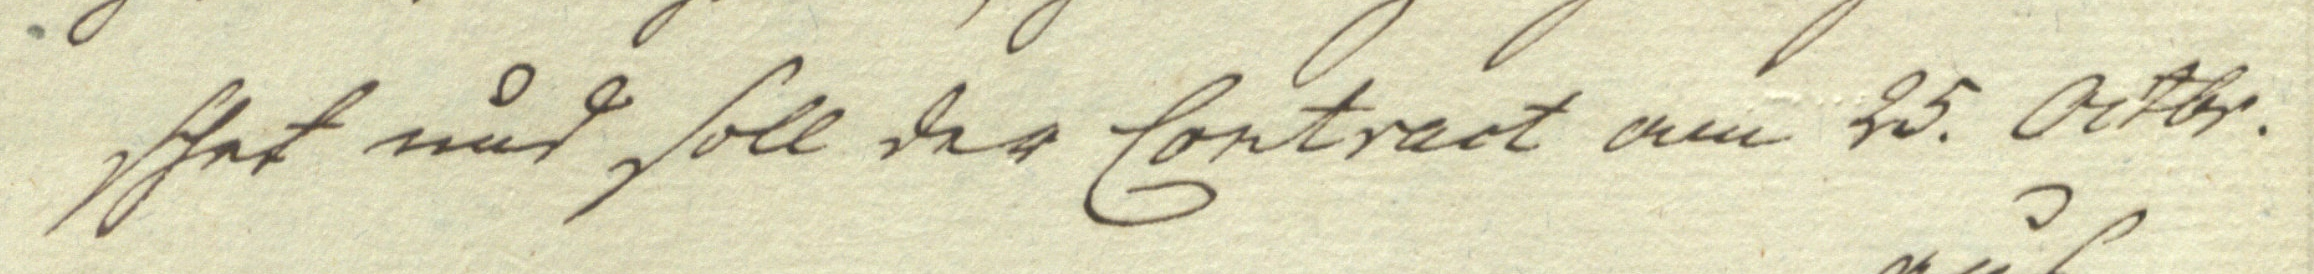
schet und soll der Contract am 25. Octbr.
